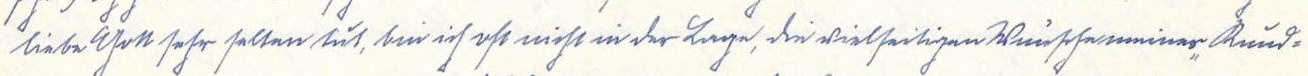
liebe Gott sehr selten tut, bin ich oft nicht in der Lage, die vielseitigen Wünsche meiner „Kund-
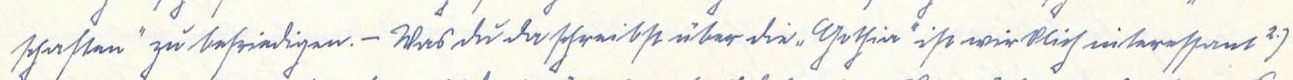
schaften“ zu befriedigen. Was du schreibst über die „Gothia“ ist wirklich interessant. 2)
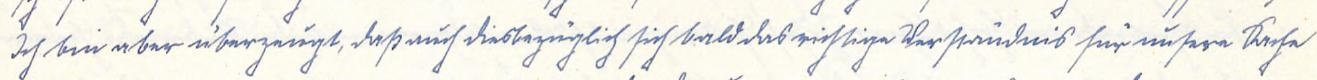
Ich bin aber überzeugt, dass auch diesbezüglich sich bald das richtige Verständnis für unsere Sache
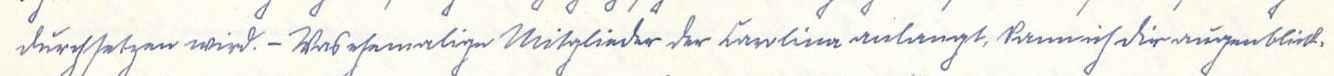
durchsetzen wird. - Was ehemalige Mitglieder der Carolina anlangt, kann ich dir augenblick-
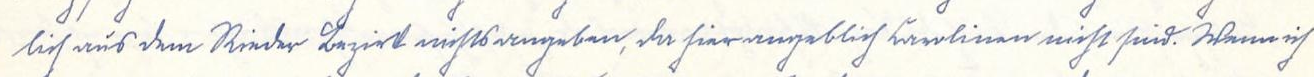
lich aus dem Rieder Bezirk nichts angeben, da hier angeblich Caroline nicht sind. Wenn ich
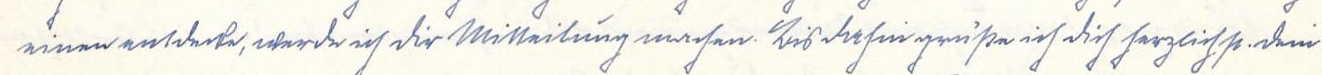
einen entdecke, werde ich dir Mitteilung machen. Bis dahin grüße ich idch herzlichst dein
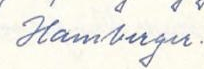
Hamberger
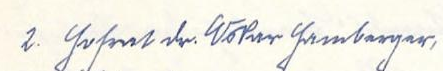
2. Hofrat Dr. Oskar Hamberger
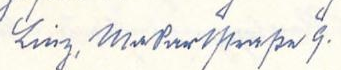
Linz, Markartstraße 9.
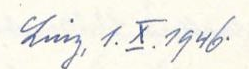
Linz, 1.X.1946
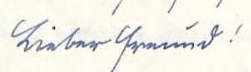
Lieber Freund!
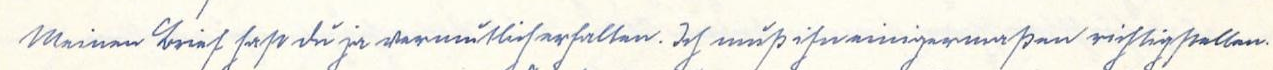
Meinen Brief hast du vermutlich erhalten. Ich muss ihn einigermaßen richtigstellen.
